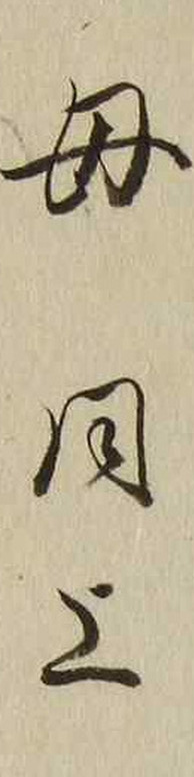母同上

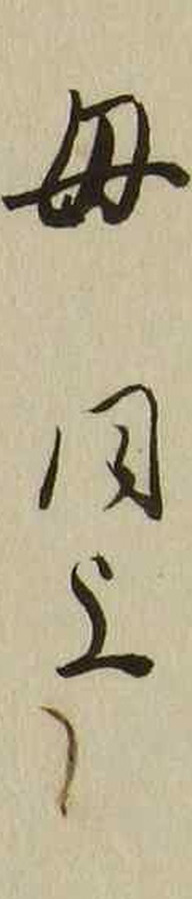母同上
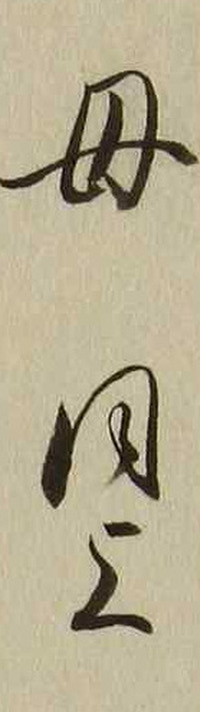母同上
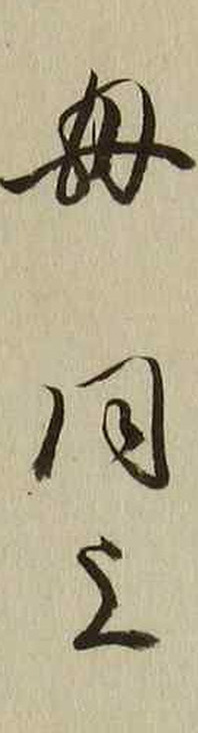母同上
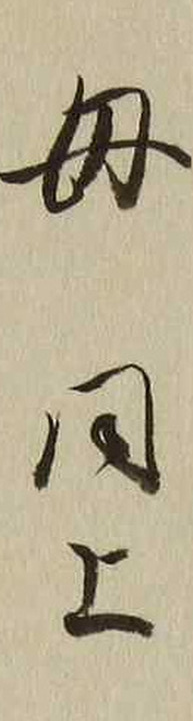母同上

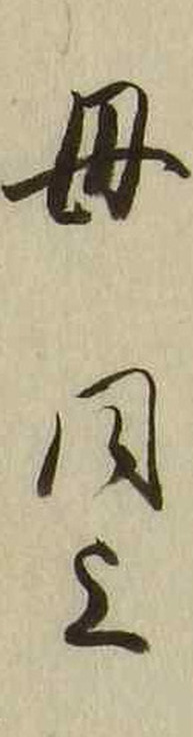母同上
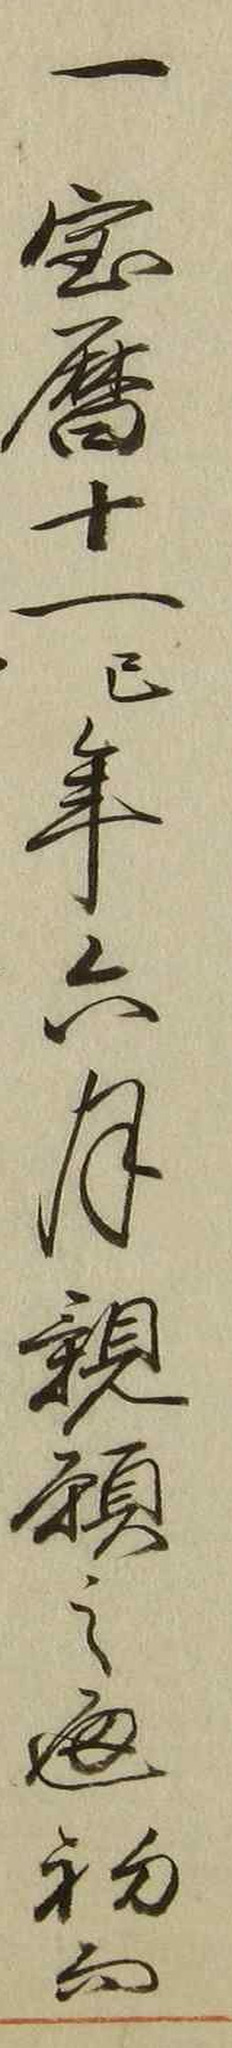一宝暦十一巳年六月親願之通初而
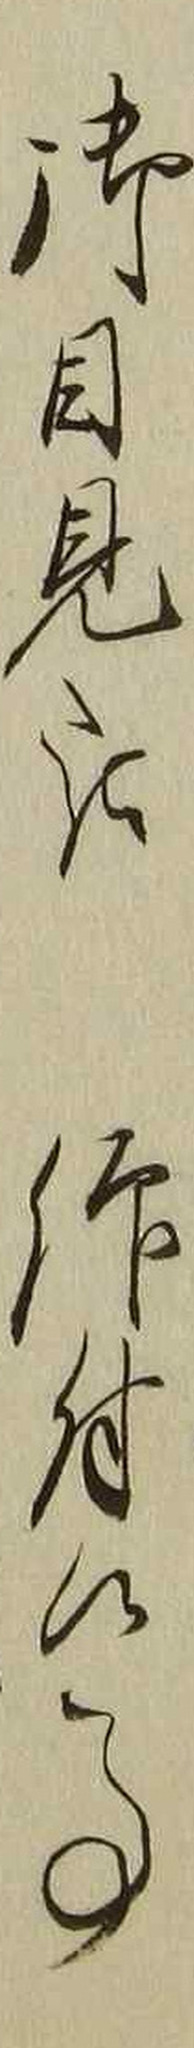之御目見被仰付候事
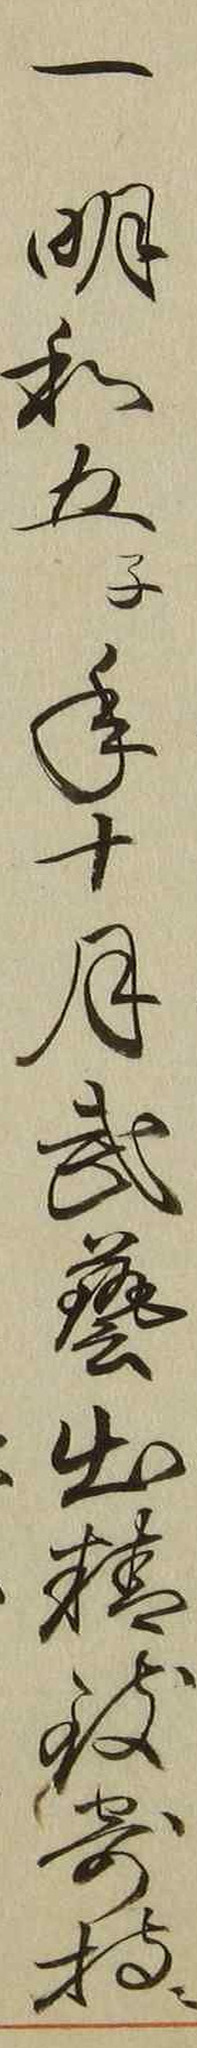一明和五子年武芸出精致奇特ニ
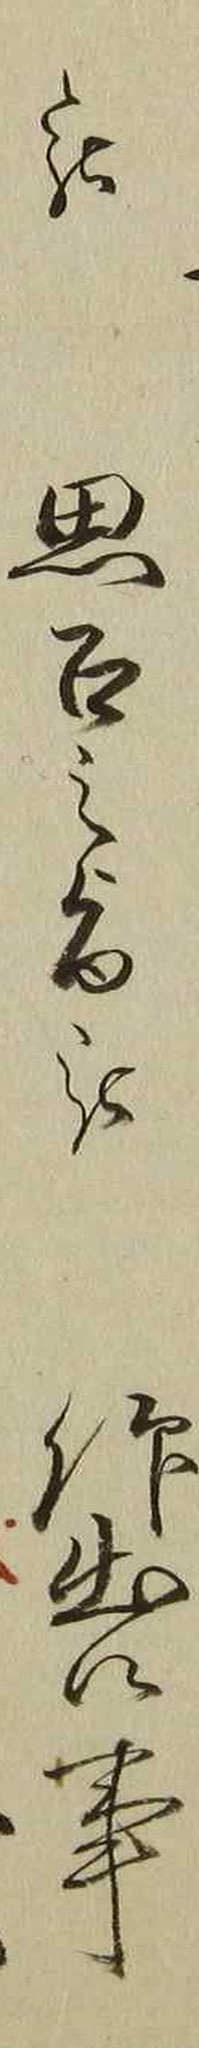被思召之旨被仰出候事
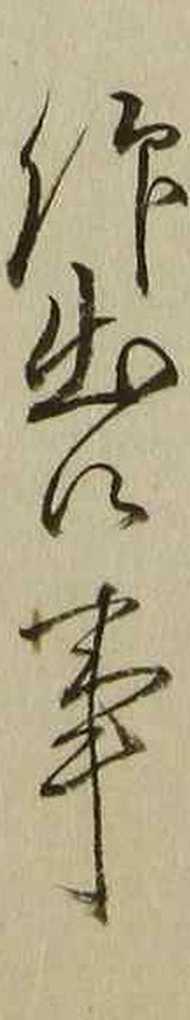仰付候事
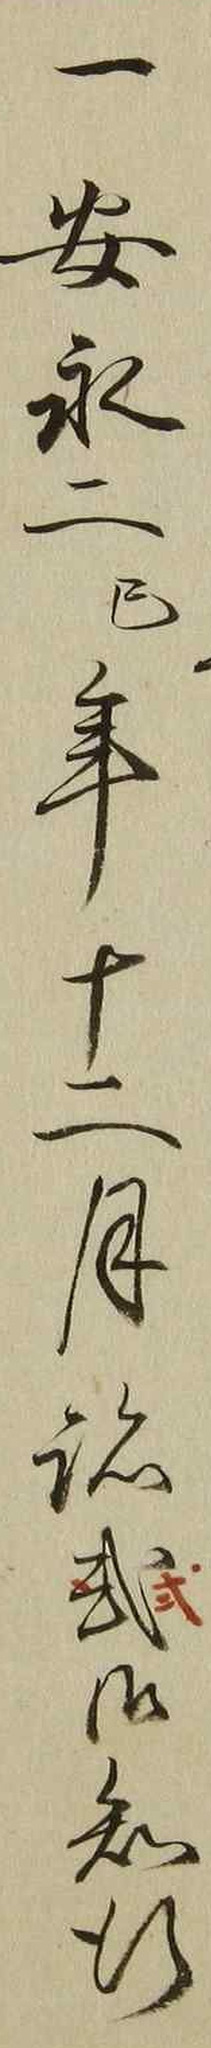一安永二巳年十二月跡弐御知行
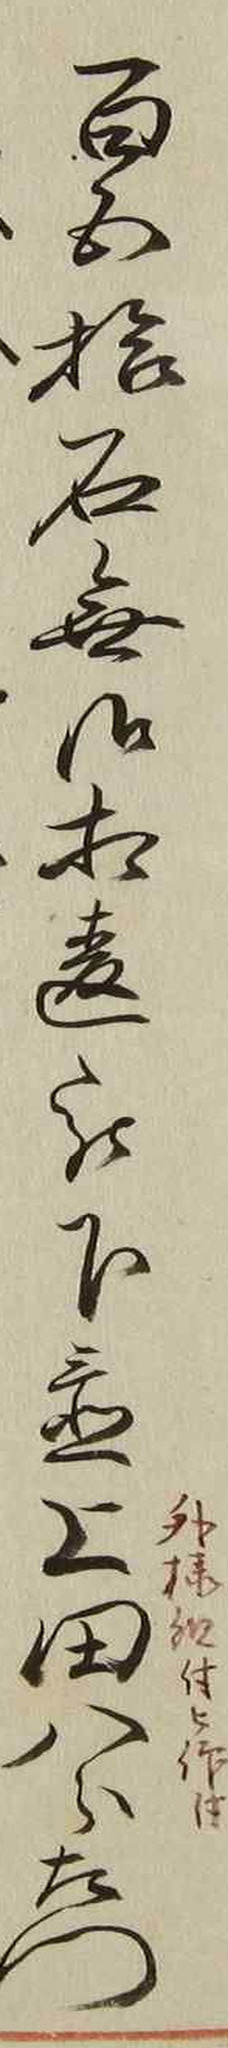百五拾石無御相違被下置上田八郎左衛門
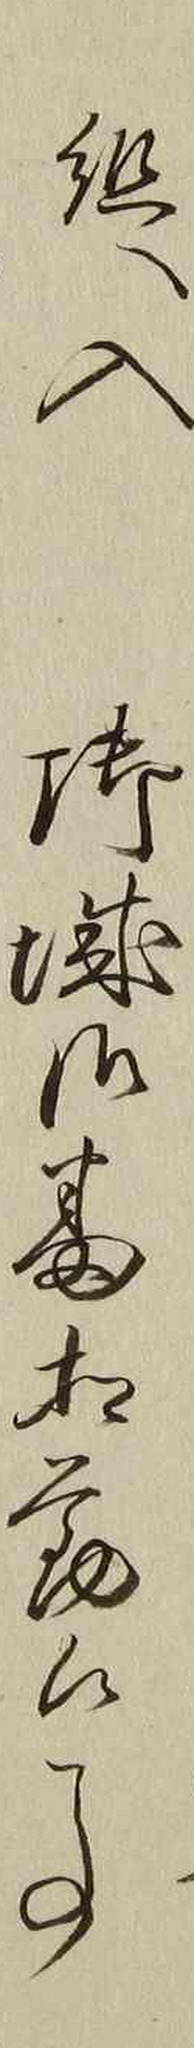組へ入御城御番相勤候事
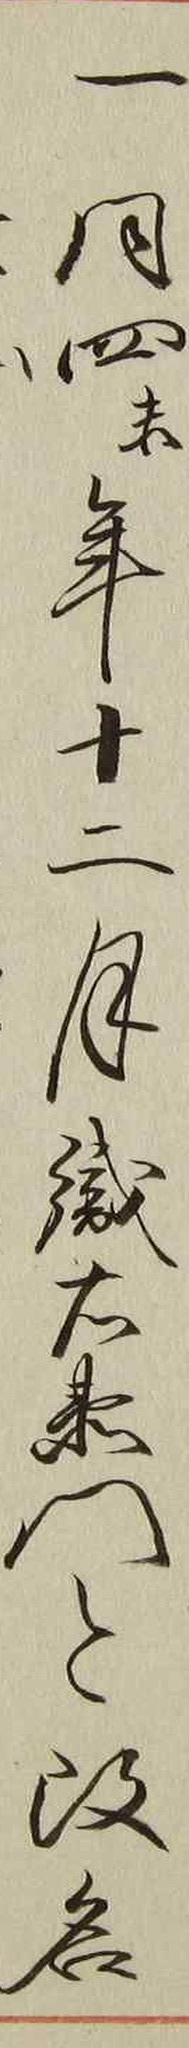一同四未年十二月織右衛門と改名
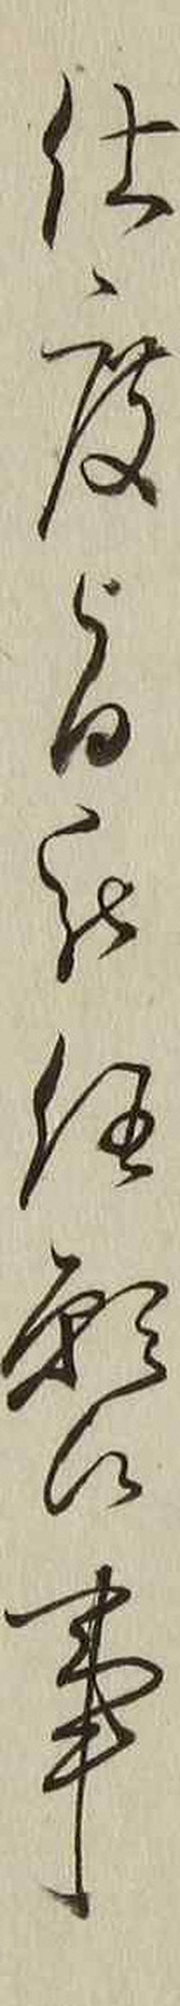仕度旨被罷願候事
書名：諸士系譜　巻之54　ほ之部1
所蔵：会津若松市立会津図書館
